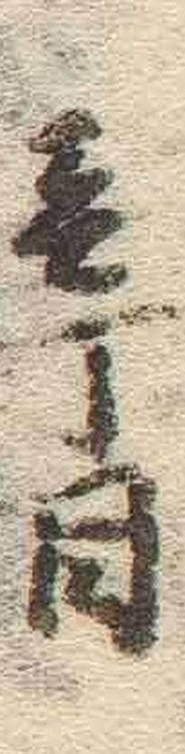壱丁目
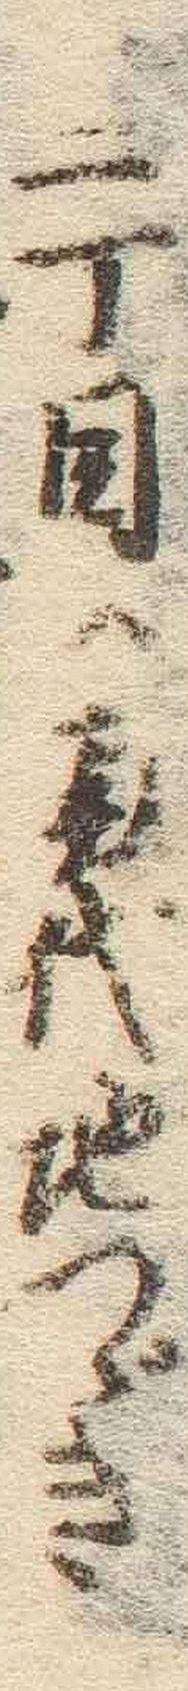二丁目は南代地つゞき
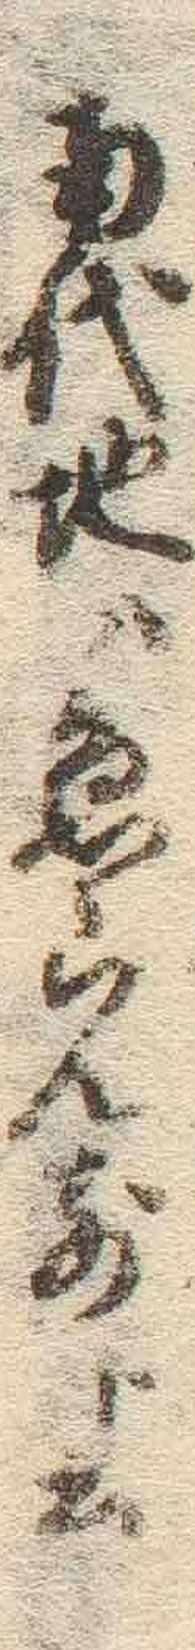南代地は魚らん前ト云
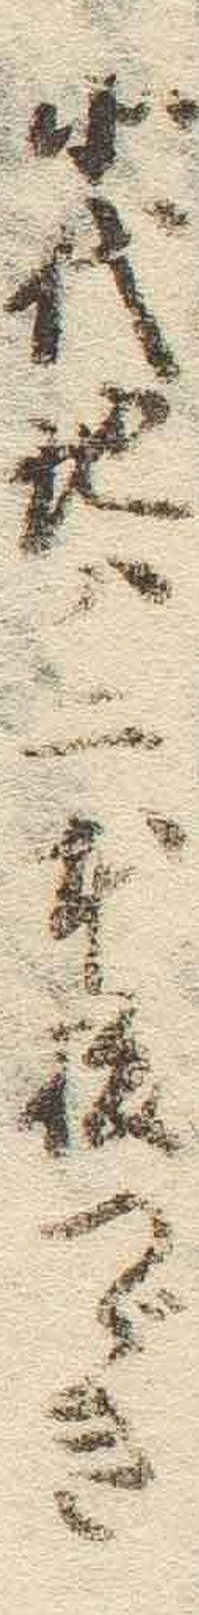北代地は二本榎つゞき
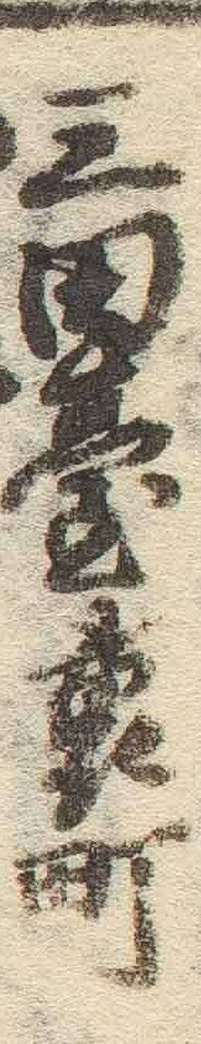三田台裏町
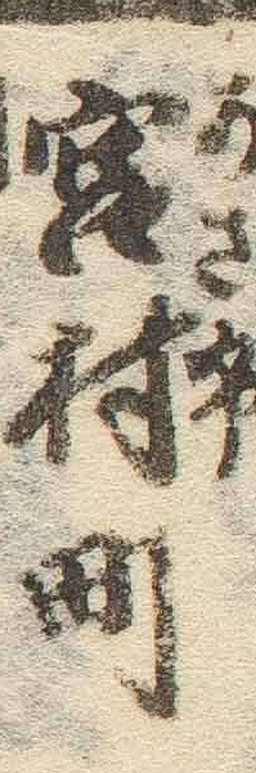宮下町
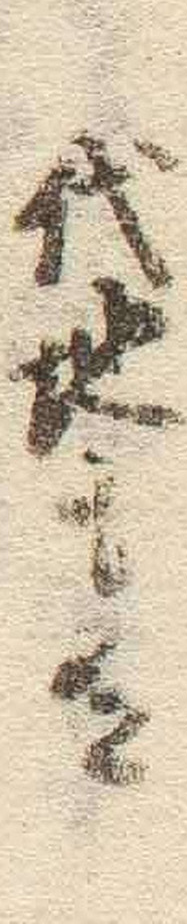代地も有
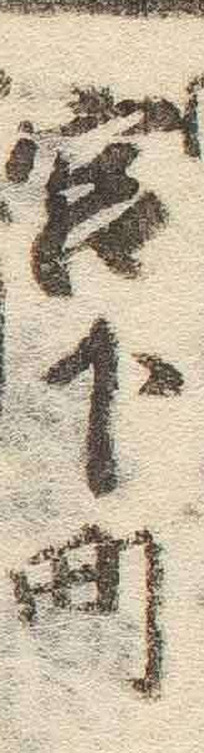宮下町
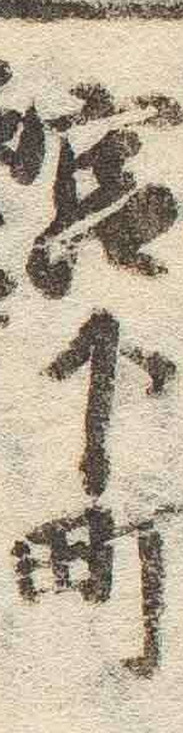宮下町
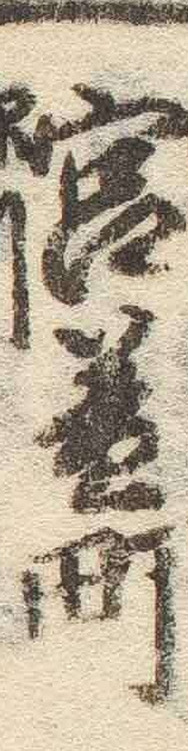宮下町
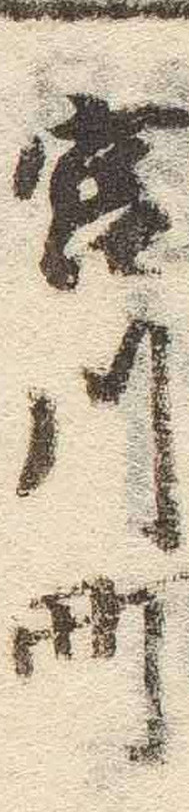宮下町
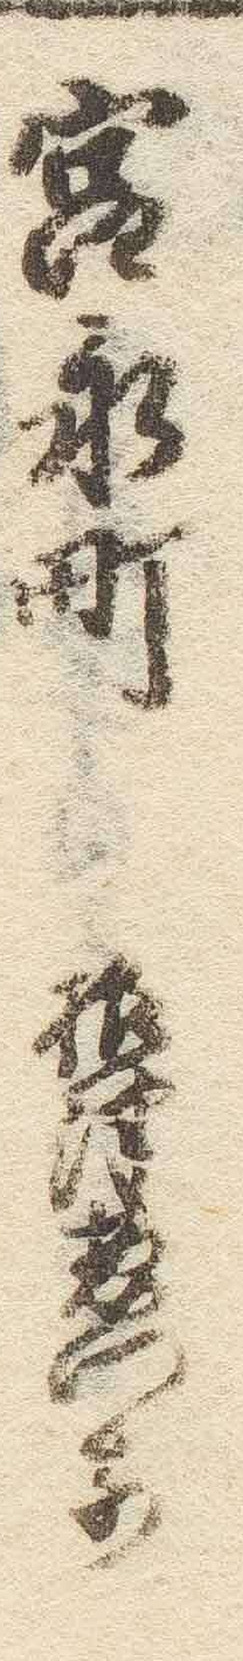宮永町根津惣門前
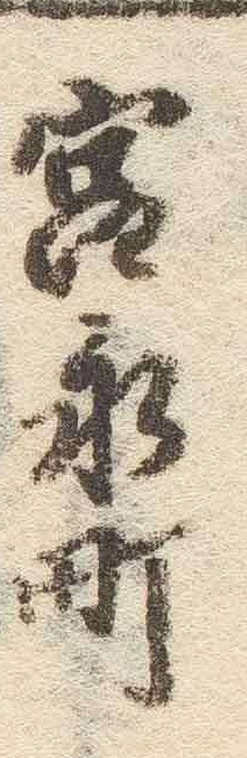宮下町
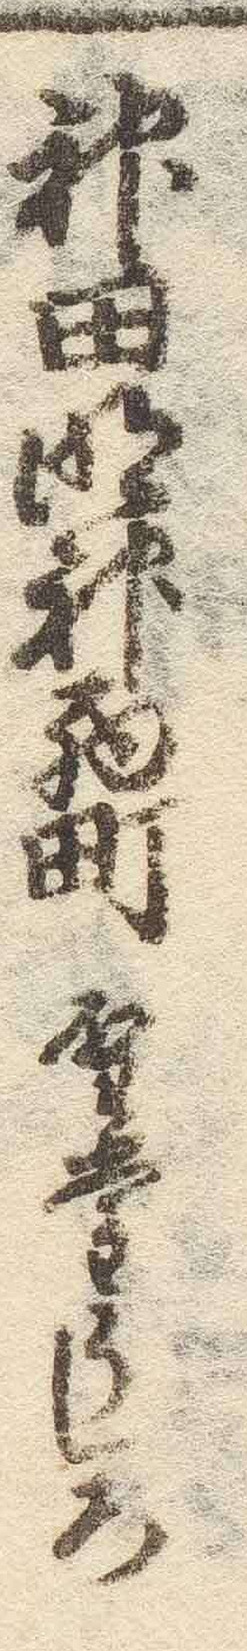神田明神西町聖堂うしろ
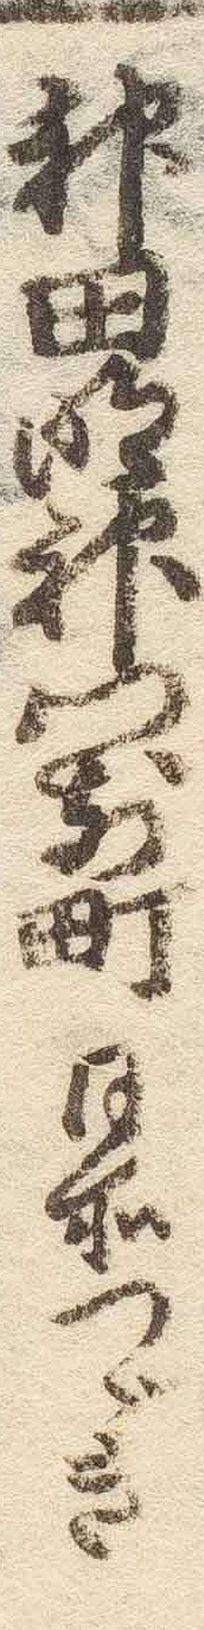神田明神門前町同所つゞき
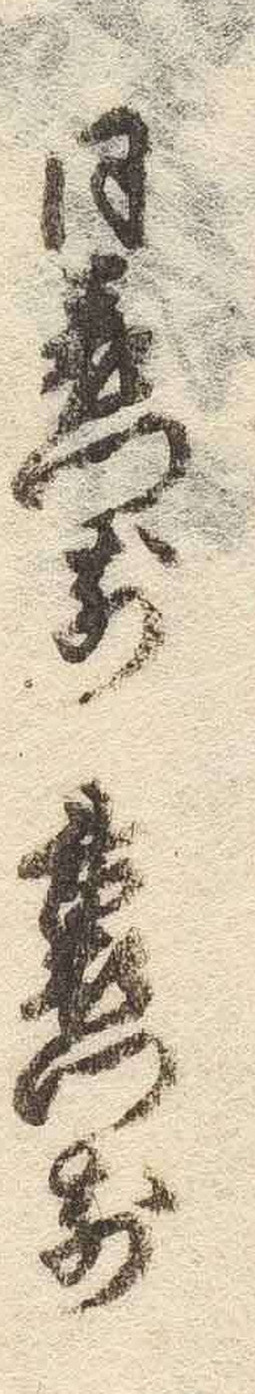同表門前裏門前
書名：江戸町独案内
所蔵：東京学芸大学附属図書館 国文学研究資料館
